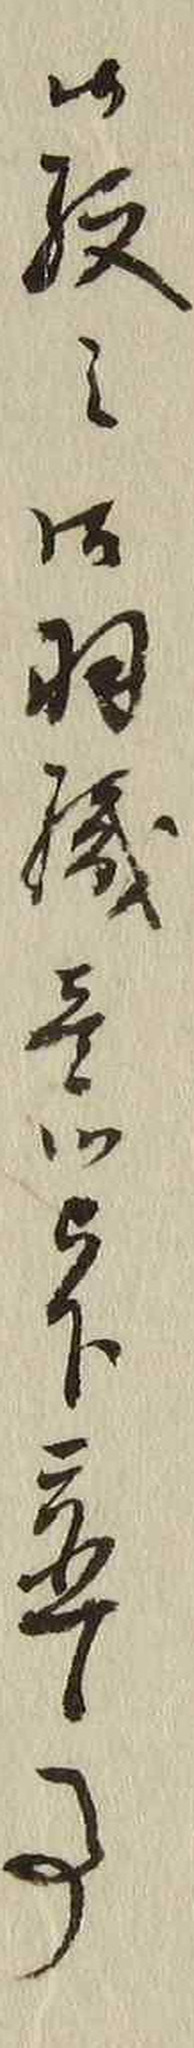御紋之御羽織壱ツ被下置候事
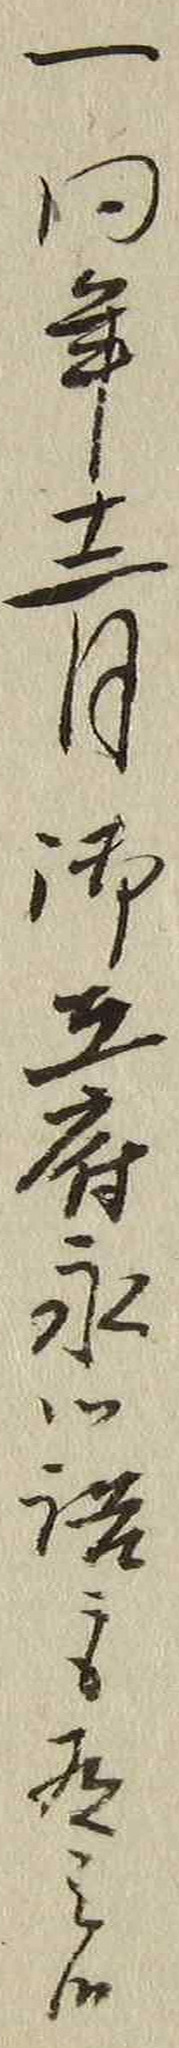一同年十二月御在府永御詰ニも有之候
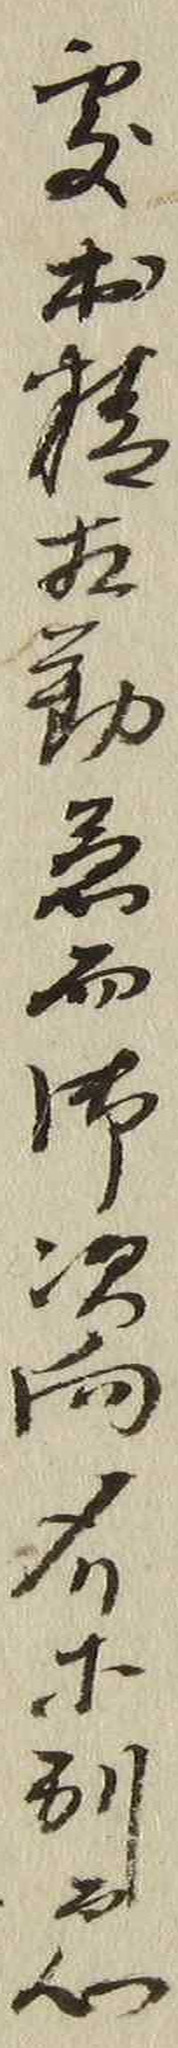処出精相勤兼而御次向〆り等別而心
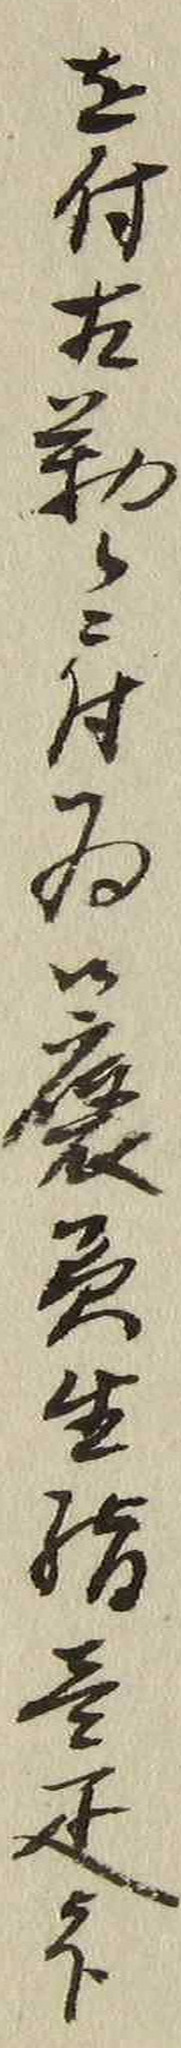を付相勤候ニ付為御褒美生絹壱疋下
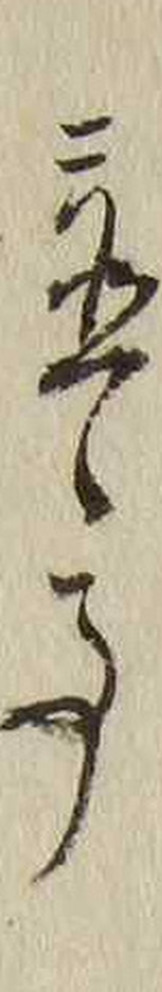置候事
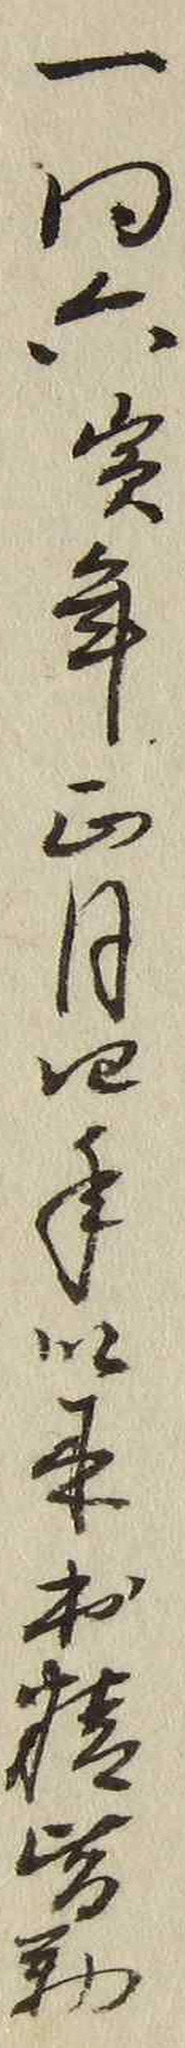一同六寅年正月四年以来出精皆勤
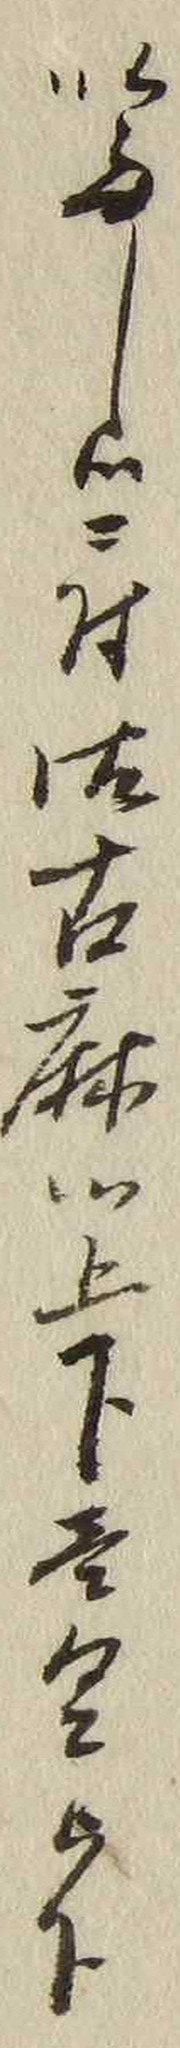いたし候ニ付御古麻御上下壱具被下
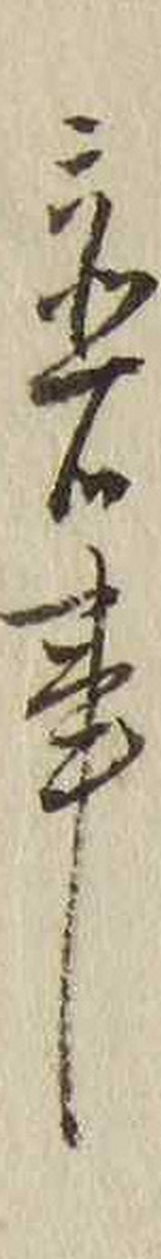置候事

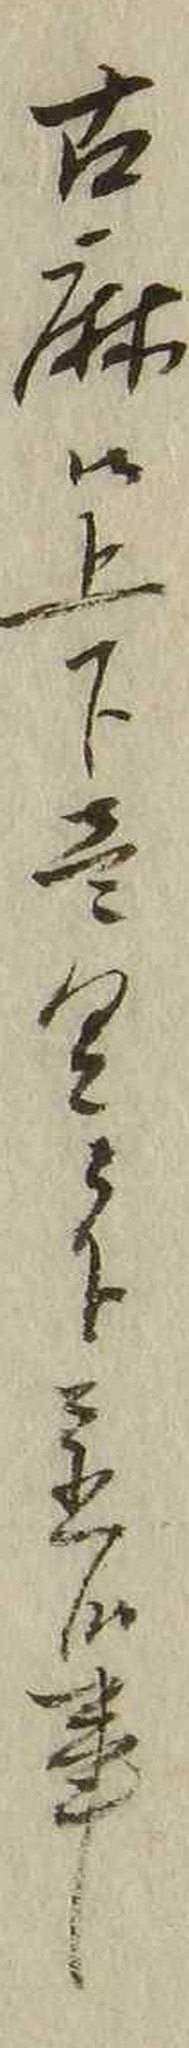古麻御上下壱具被下置候事
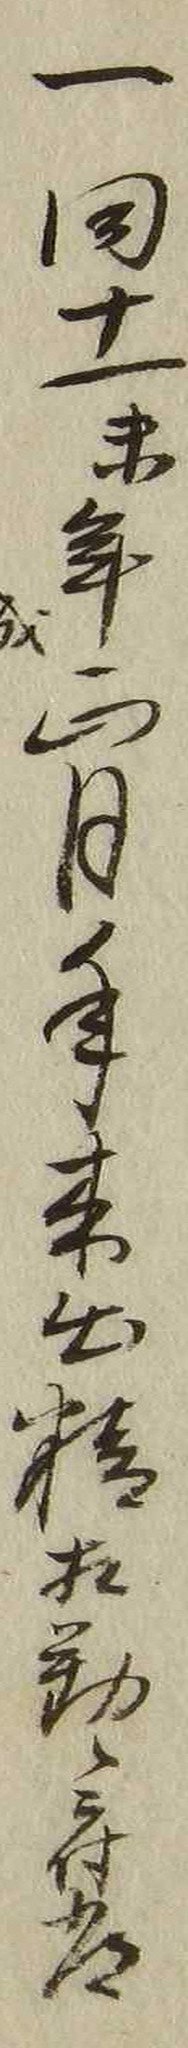一同十一未年正月年来出精相勤候ニ付常
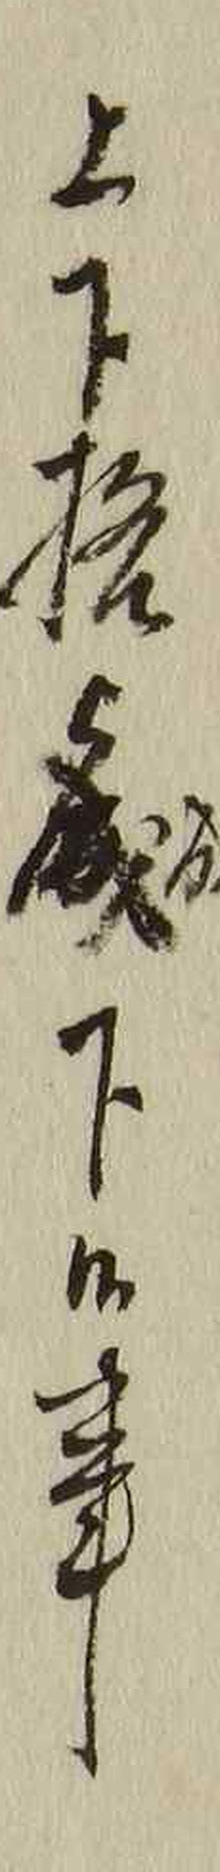上下格被成下候事
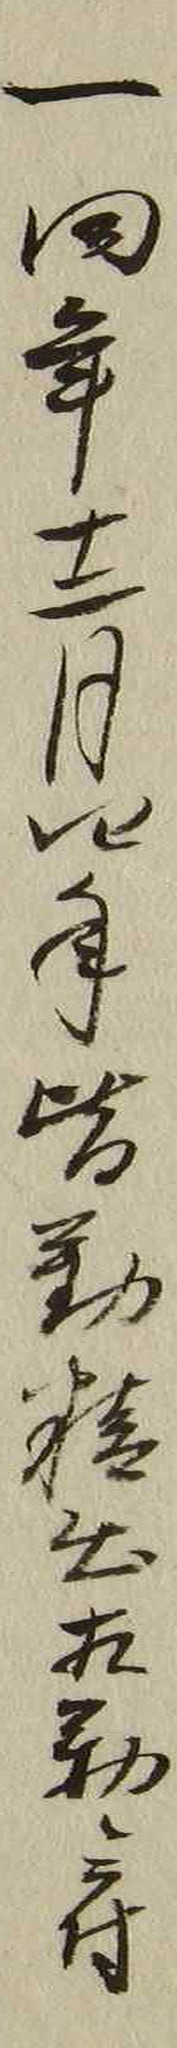一同年十二月四年皆勤精出相勤候ニ付
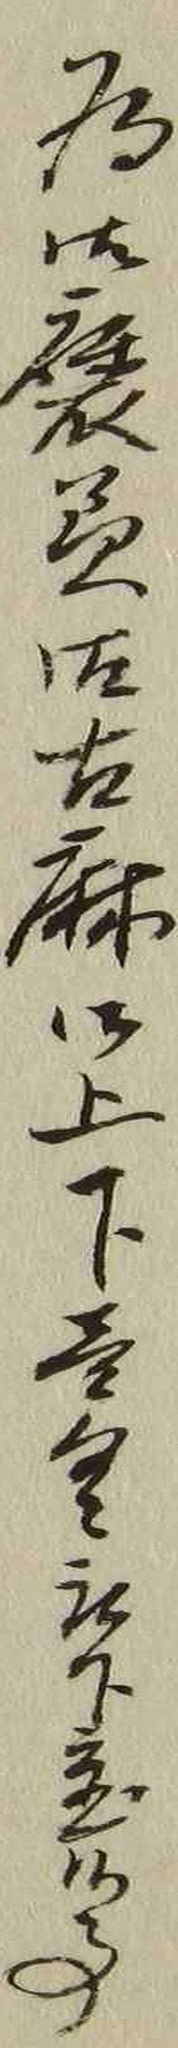為御褒美御古麻御上下壱具被下置候事
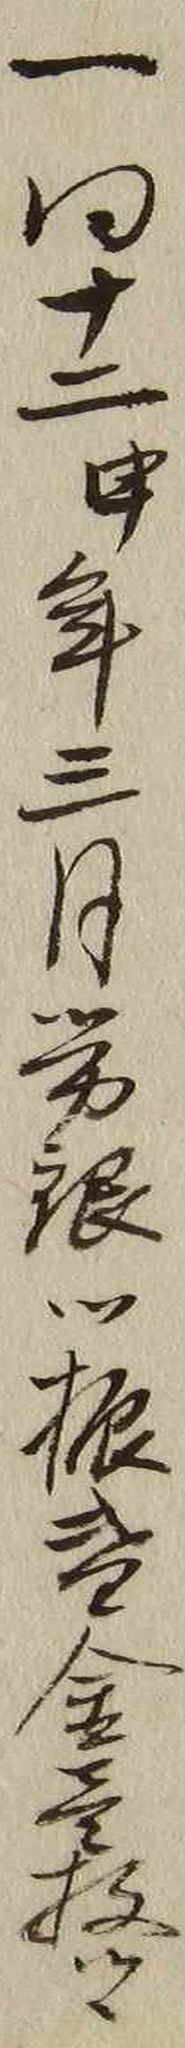一同十二申年三月労銀御振替金壱枚ツヽ
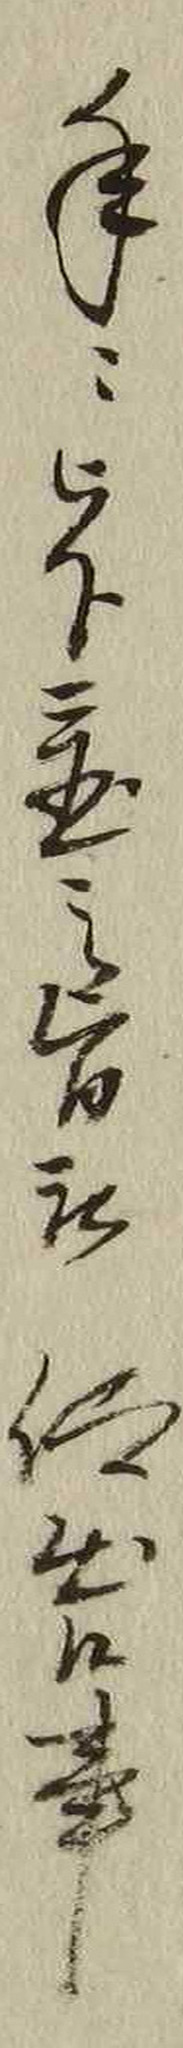年々被下置之旨被仰出事候事
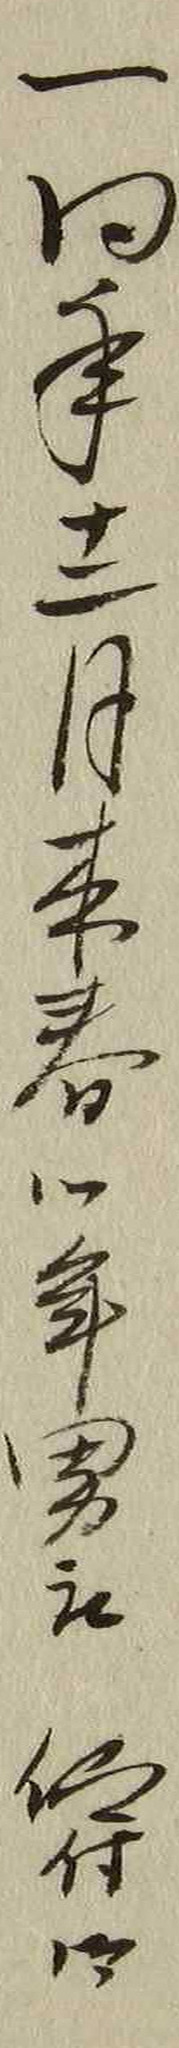一同年十二月来春御年男被仰付御
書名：諸士系譜　巻之359　す之部9
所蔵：会津若松市立会津図書館
